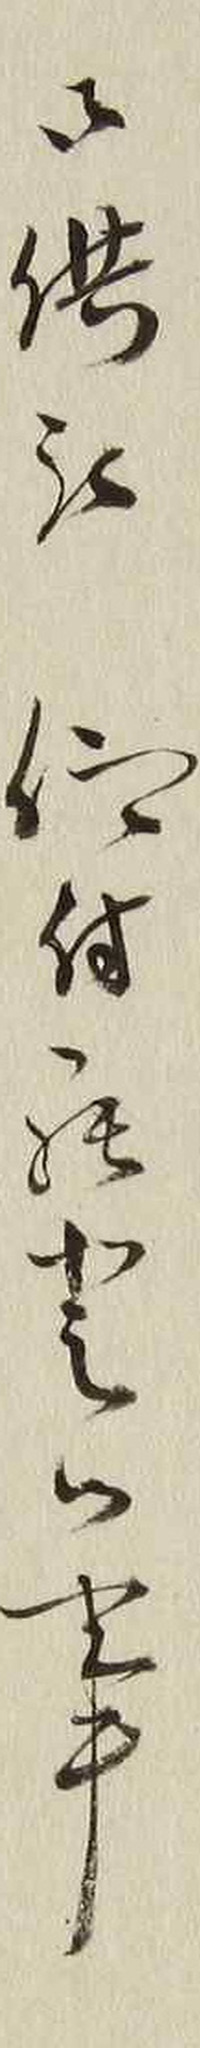御供被仰付罷登候事
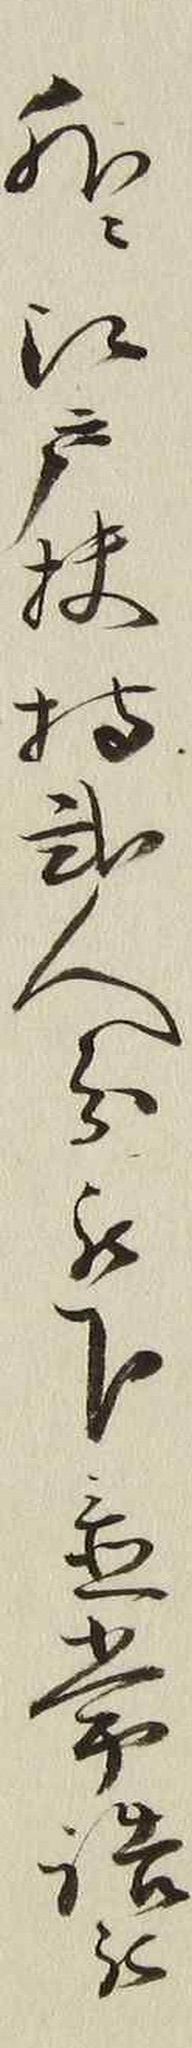外に江戸扶持弐人分被下置常詰被
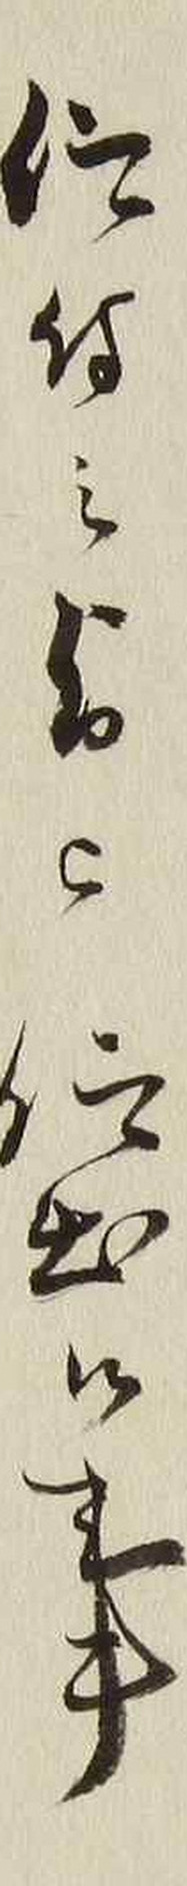仰付之旨被仰出候事
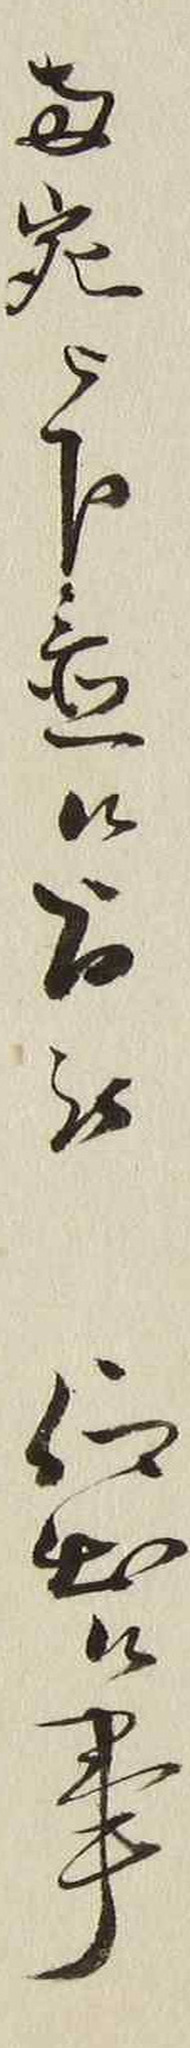両宛被下置候旨被仰出候事
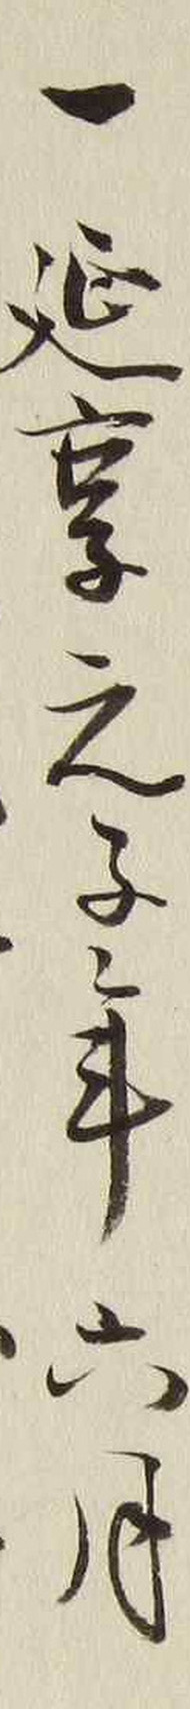一延享元子年六月
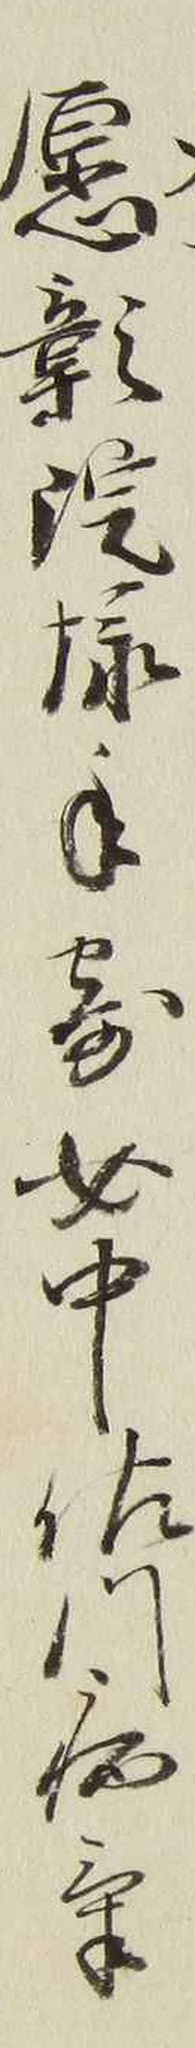愿彰院様年寄女中佐川病気
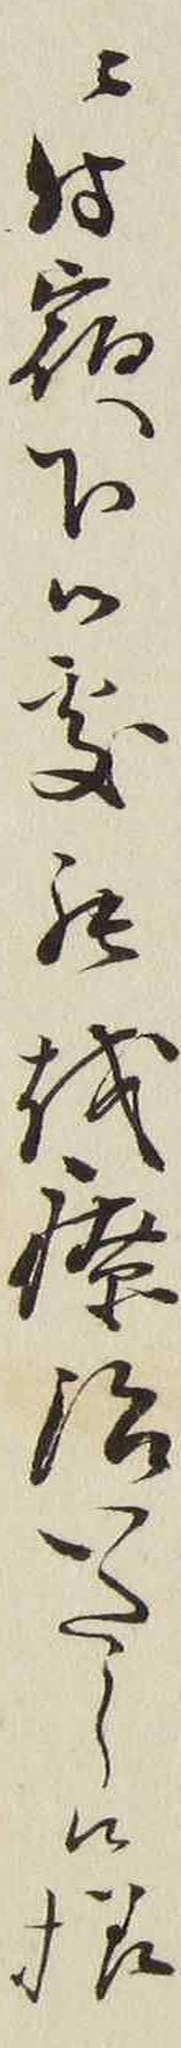に付宿へ下候処罷越療治いたし候様

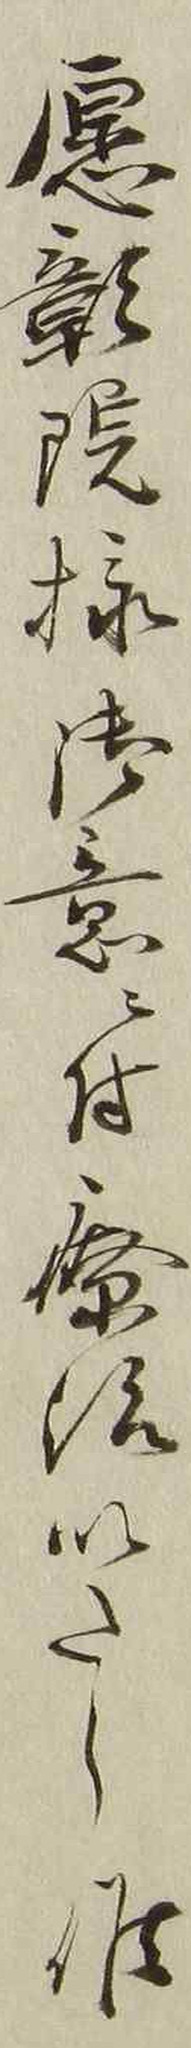愿彰院様御意に付療治いたし候
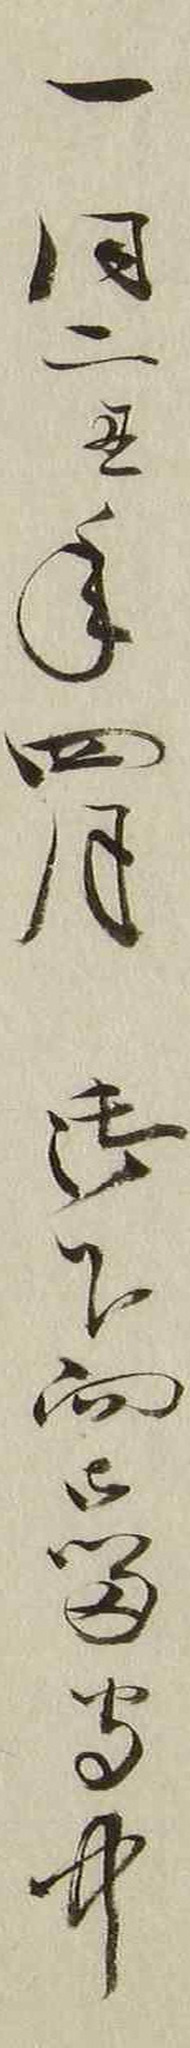一同二丑年四月御下向御留守中
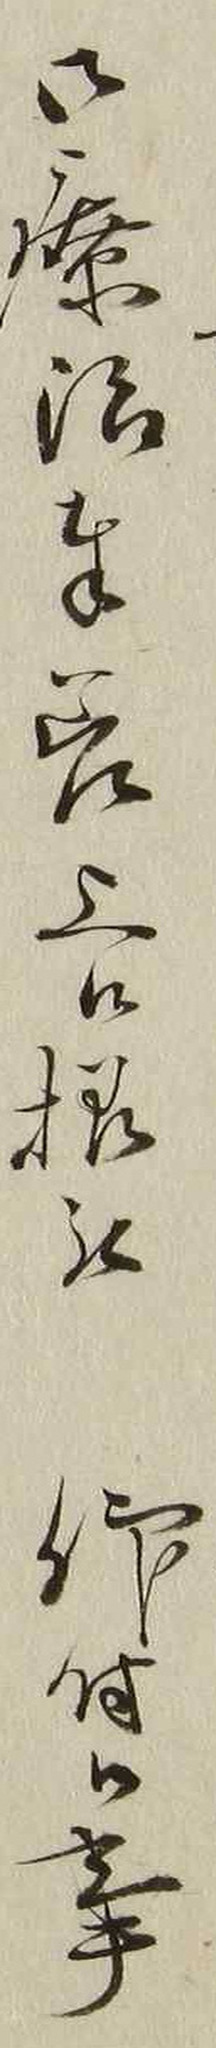御療治奉差上候様被仰付候事
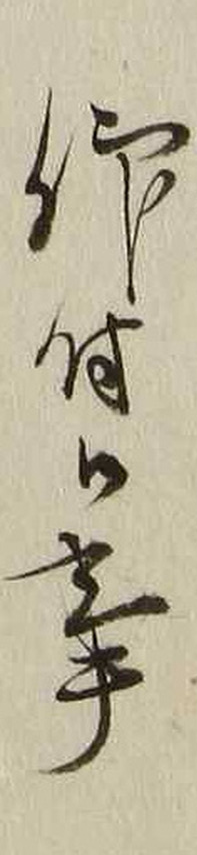仰付候事
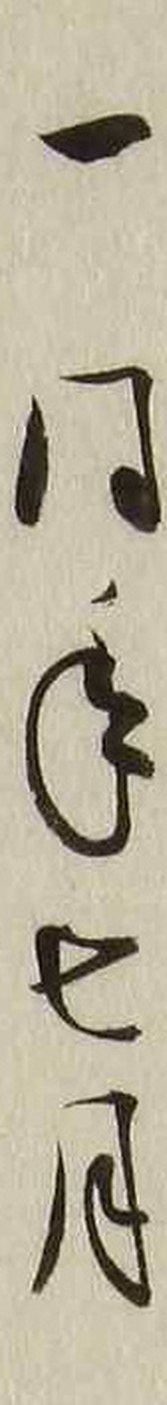一同年七月
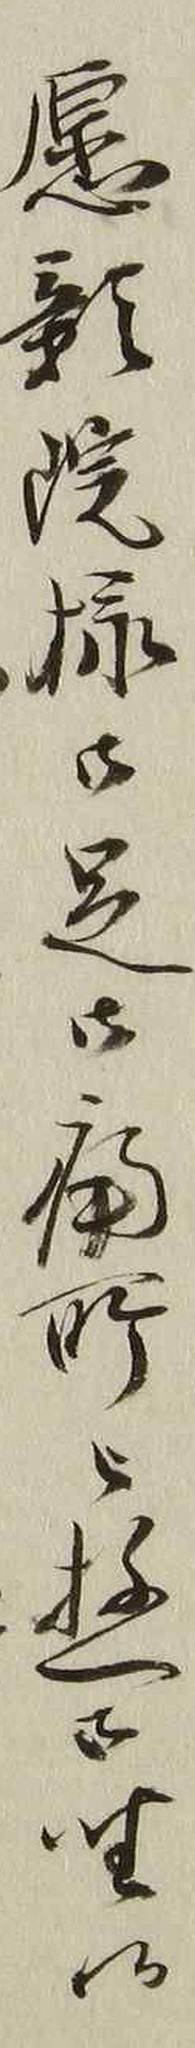愿彰院様御足御痛所被遊御坐候
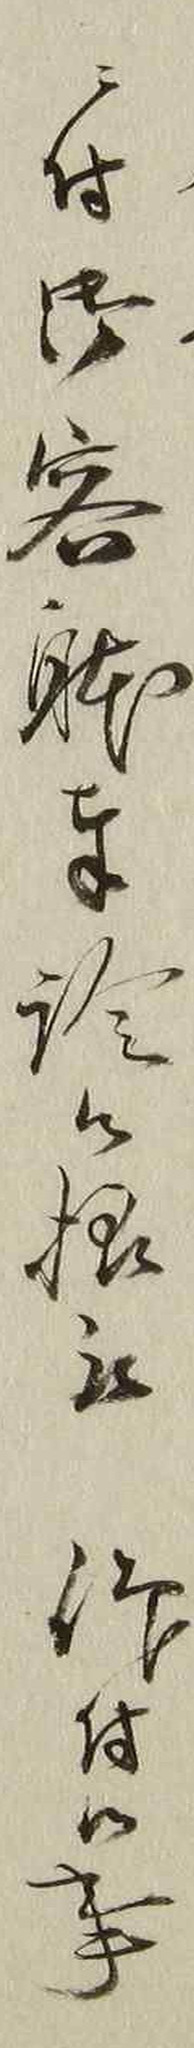に付御容体奉診候様被仰付候事
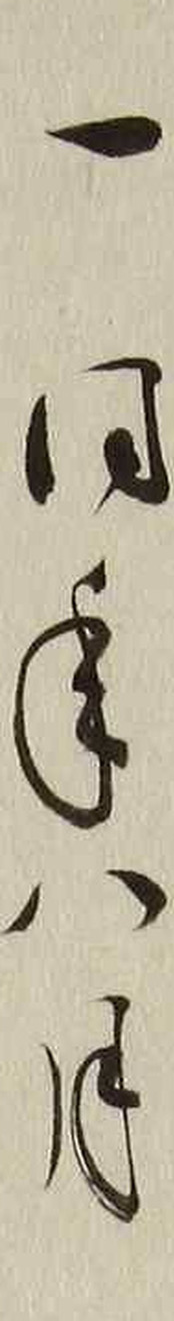一同年八月
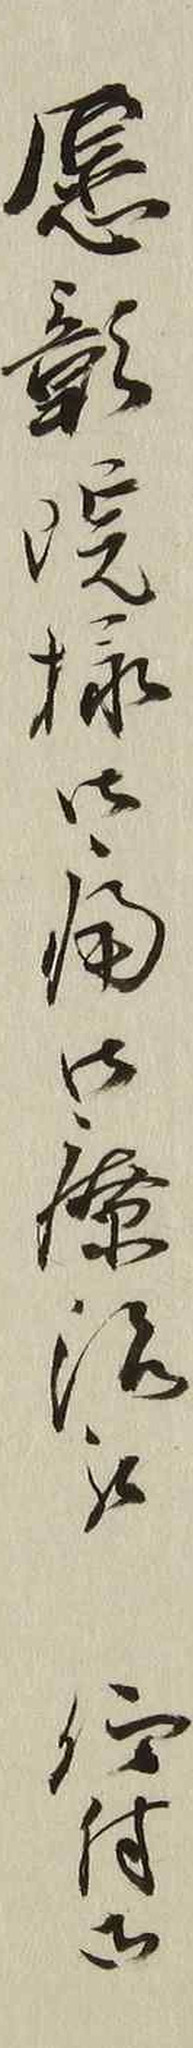愿彰院様御痛御療治被仰付御
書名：諸士系譜　巻之157　ね之部1
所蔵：会津若松市立会津図書館
